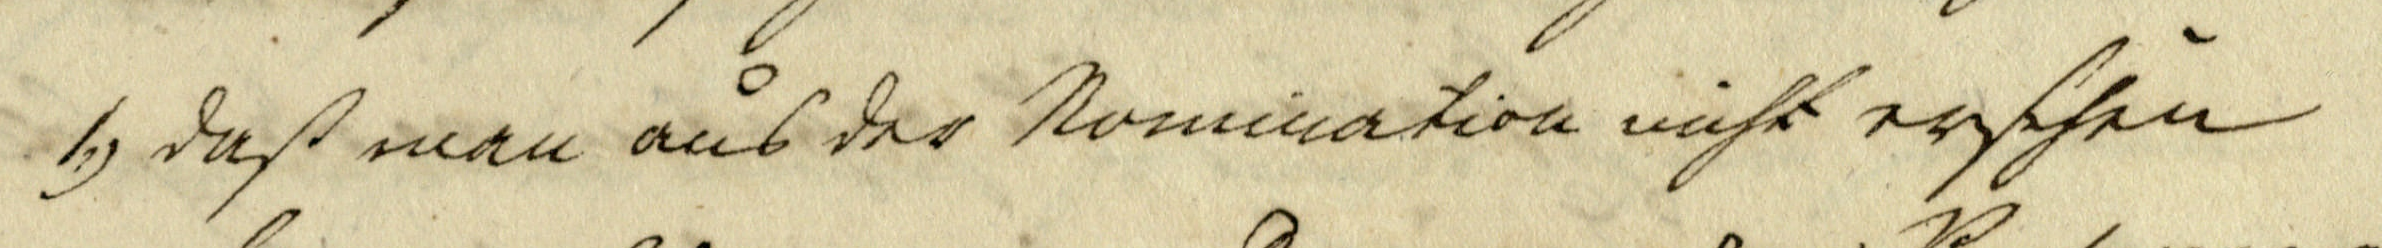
1, daß man aus der Nomination nicht ersehen
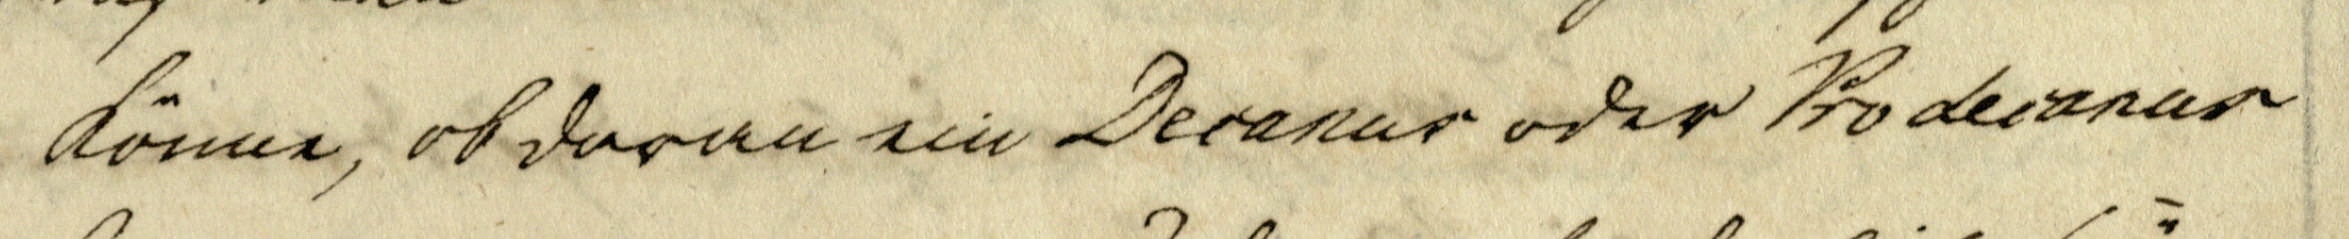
könne, ob daran ein Decanus oder Prodecanus
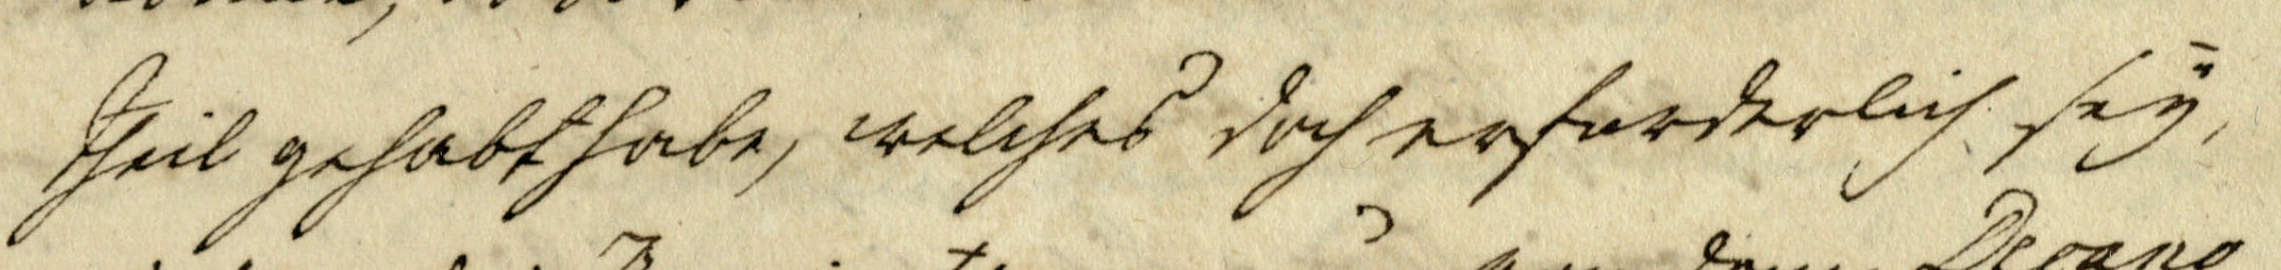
Theil gehabt habe, welches doch erforderlich seÿ,
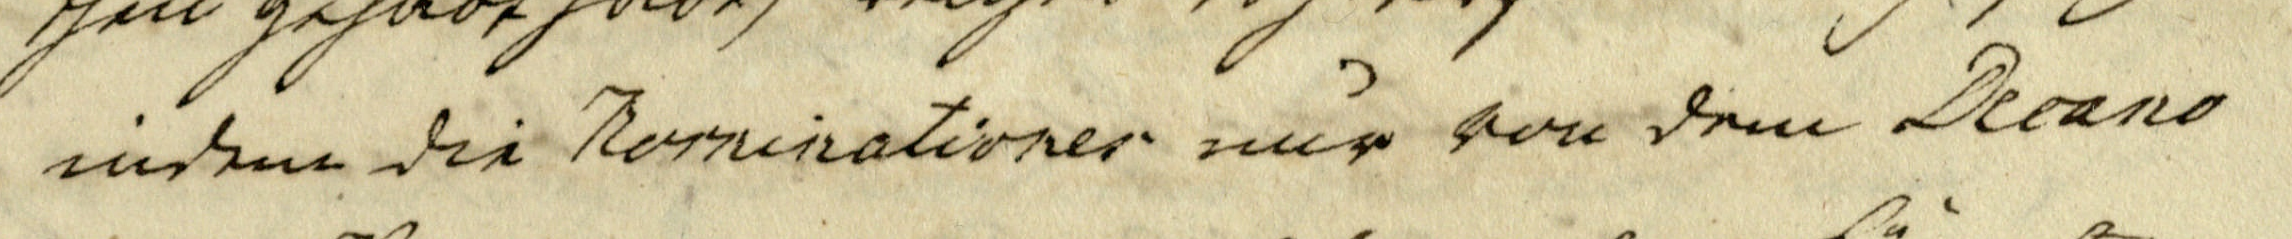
indem die Nominationes nur von dem Decano
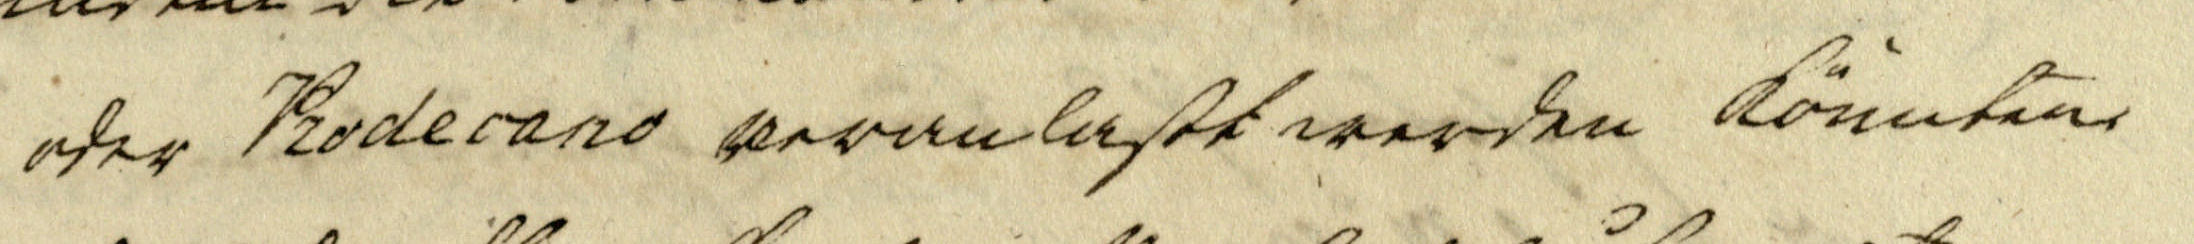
oder Prodecano veranlaßt werden könnten.
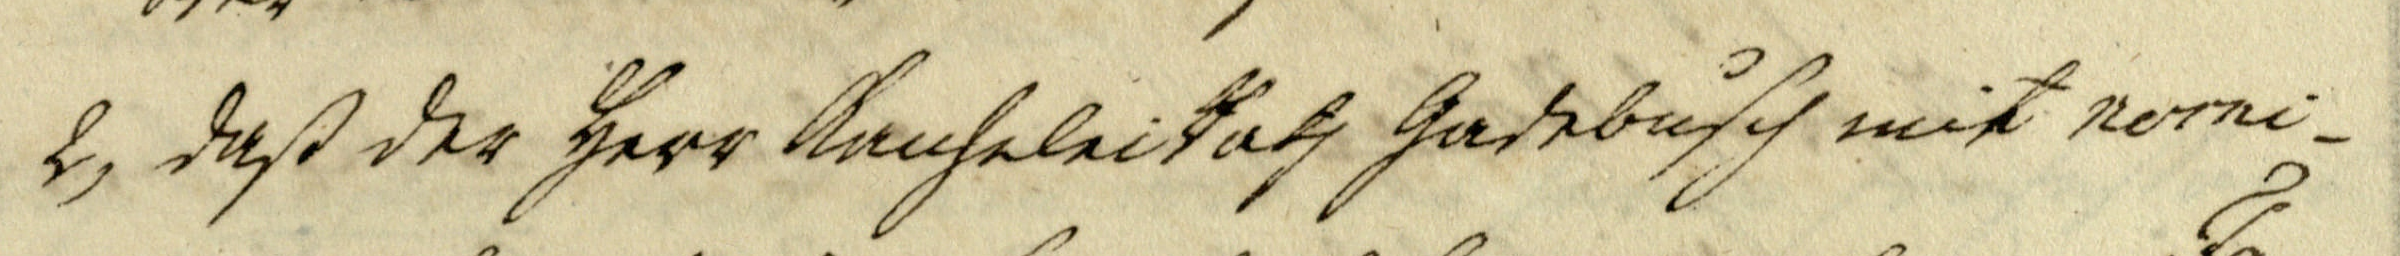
2, daß der Herr Kanzelei Rath Gadebusch mit nomi¬
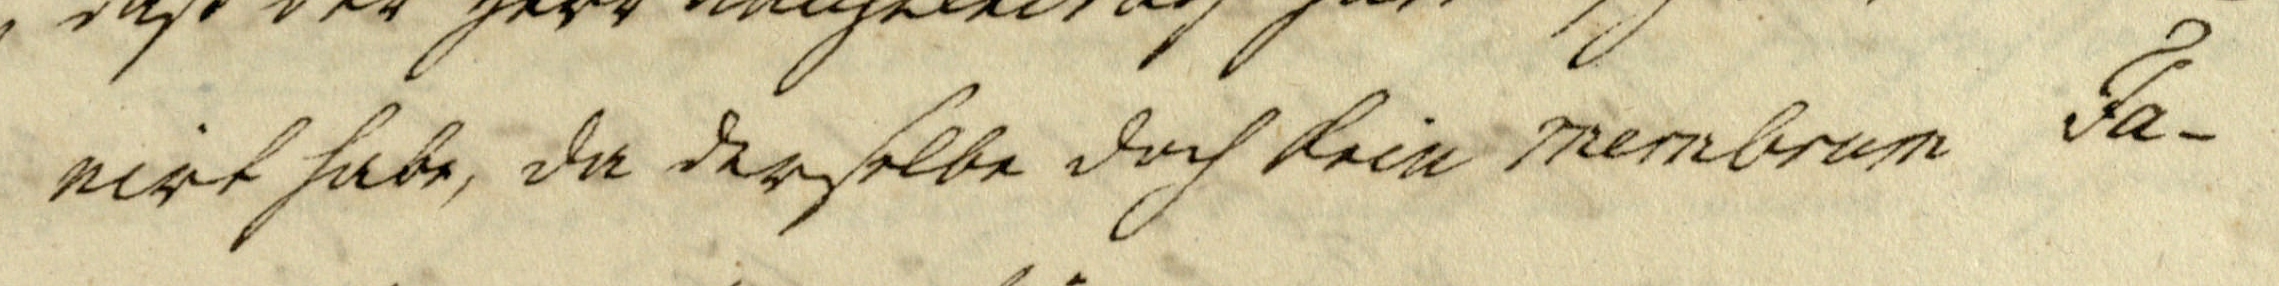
nirt habe, da derselbe doch kein membrum Fa¬
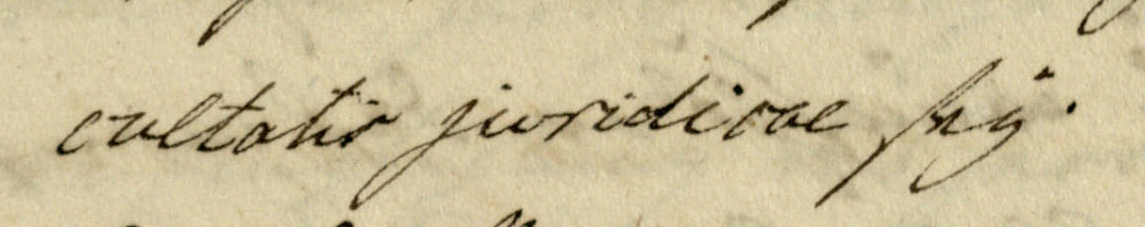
cultatis juridicae seÿ.
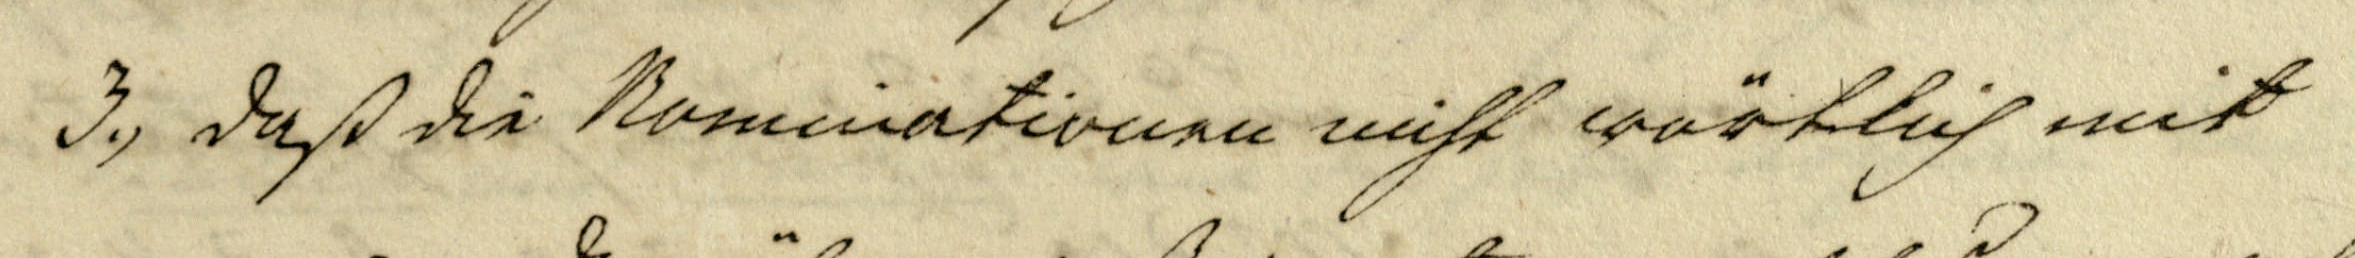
3., daß die Nominationen nicht wörtlich mit
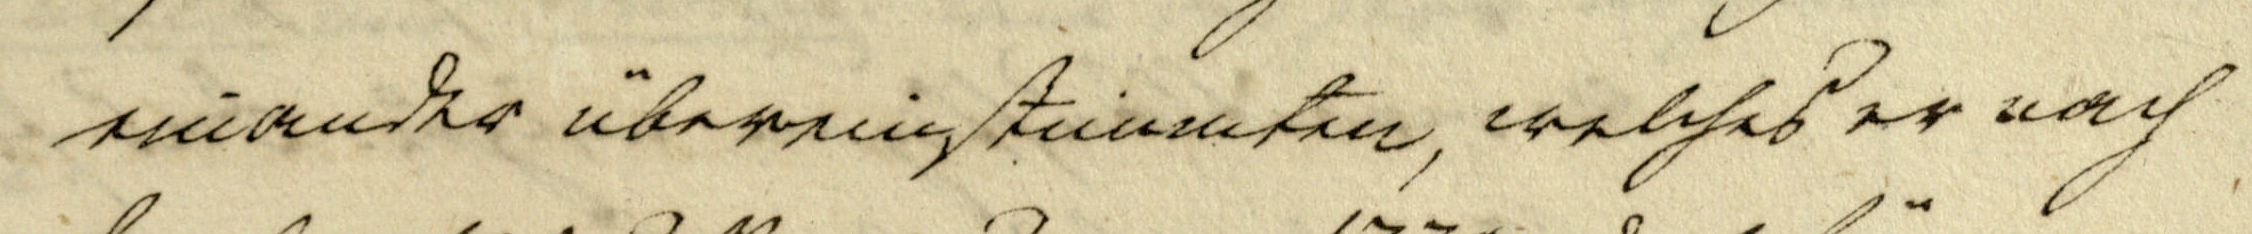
einander übereinstimmten, welches er nach
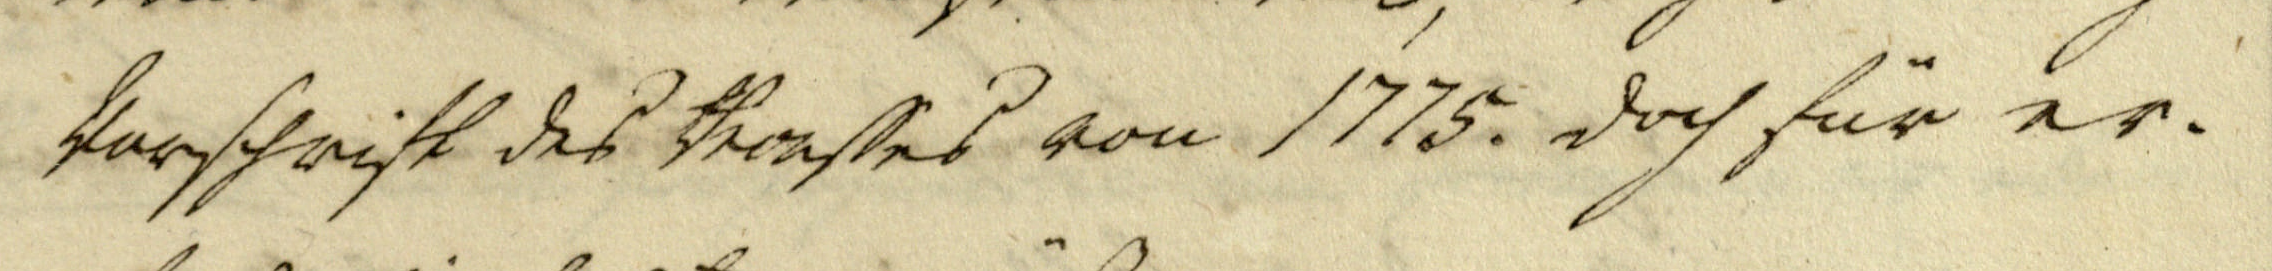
Vorschrift des Recesses von 1775. doch für er¬
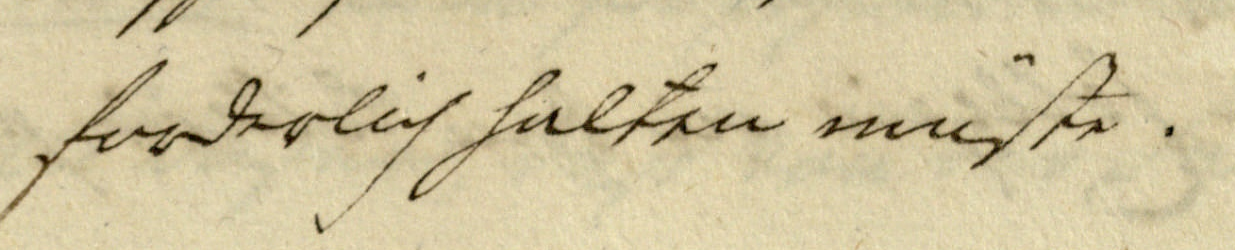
forderlich halten müßte.
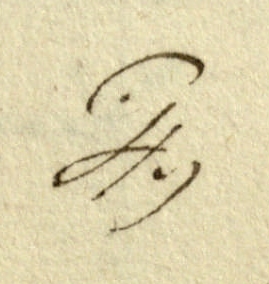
4.,
